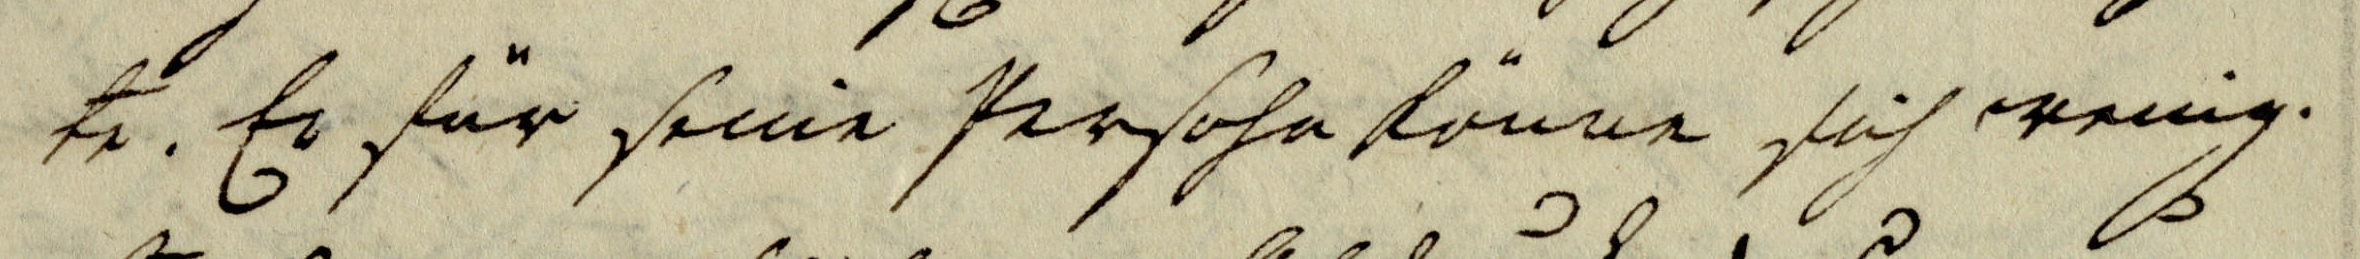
te. Er für seine Persohn könne sich wenig¬
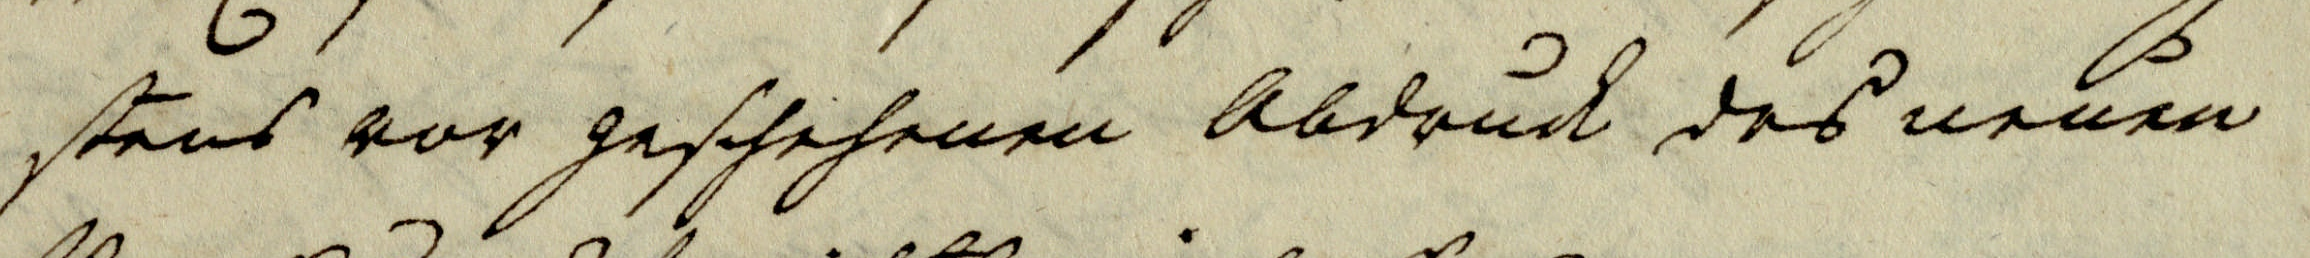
stens vor geschehenen Abdruck des neuen
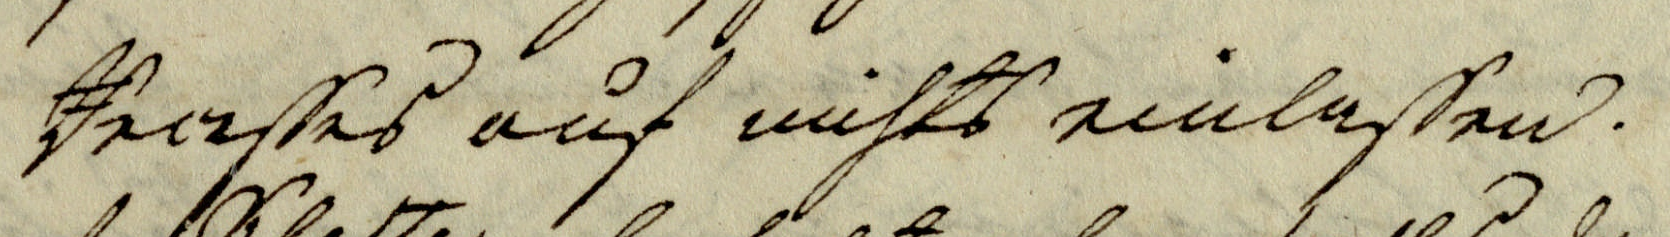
Recesses auf nichts einlassen.
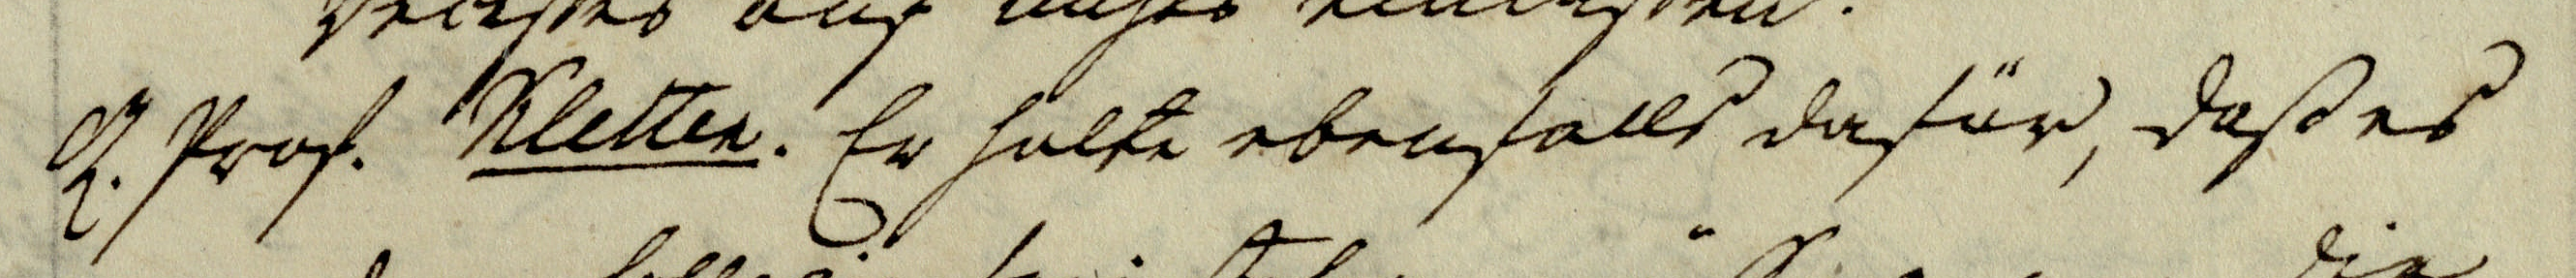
dh. Prof. Kletten. Er halte ebenfalls dafür, daß es
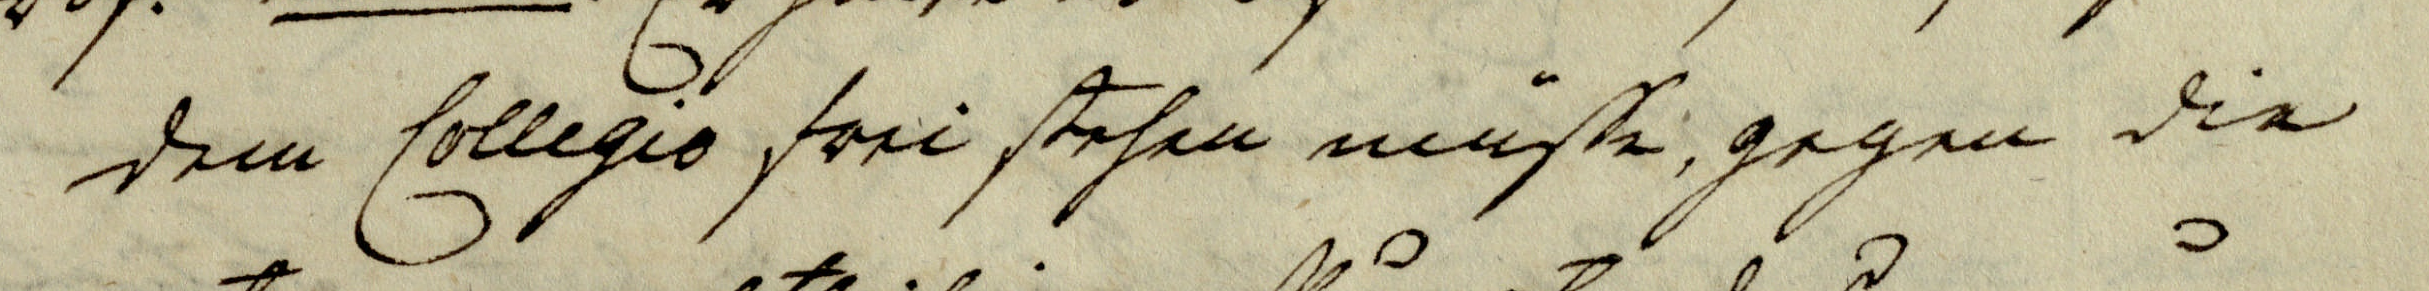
dem Collegio frei stehen müsse, gegen die
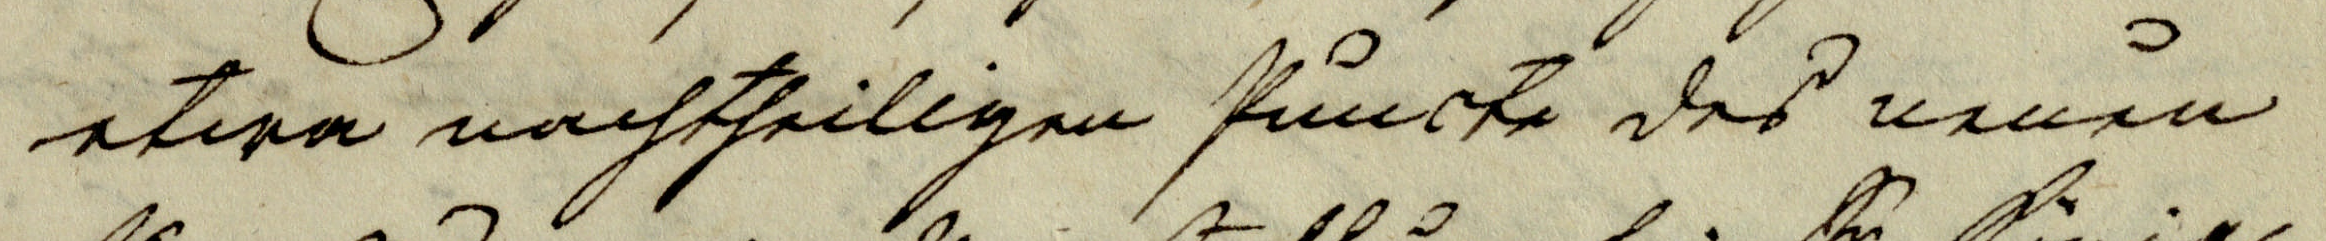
etwa nachtheiligen Puncte des neuen
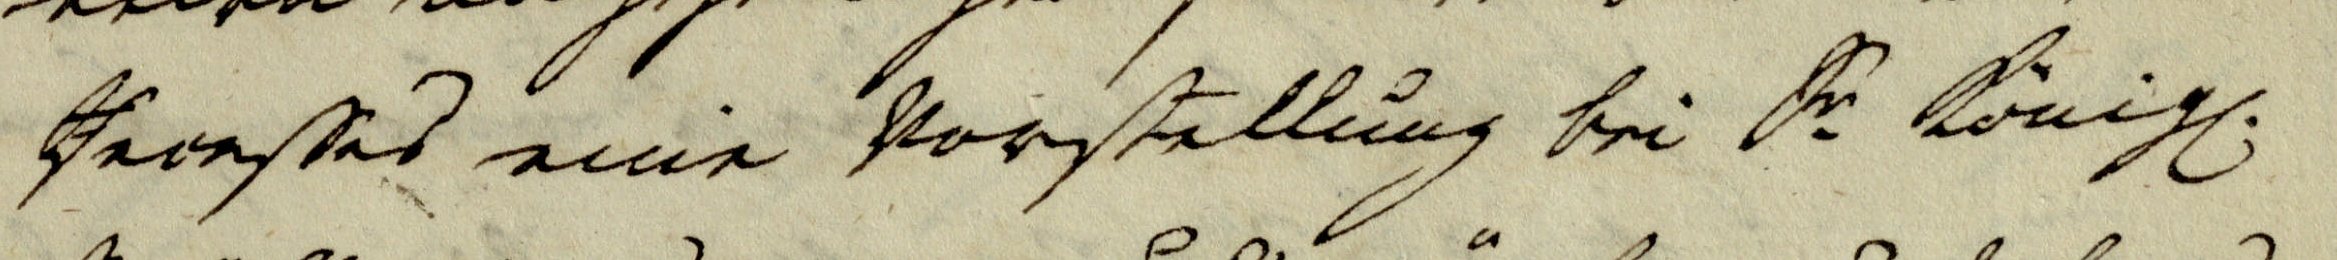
Recesses eine Vorstellung bei Sr Königl.
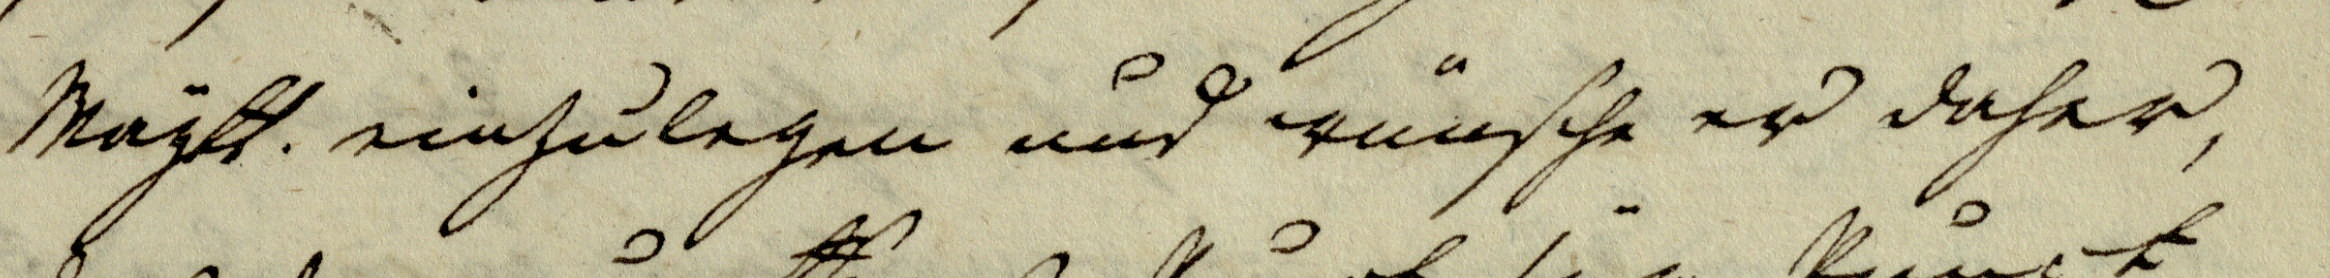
Maÿtt. einzulegen und wünsche er daher,
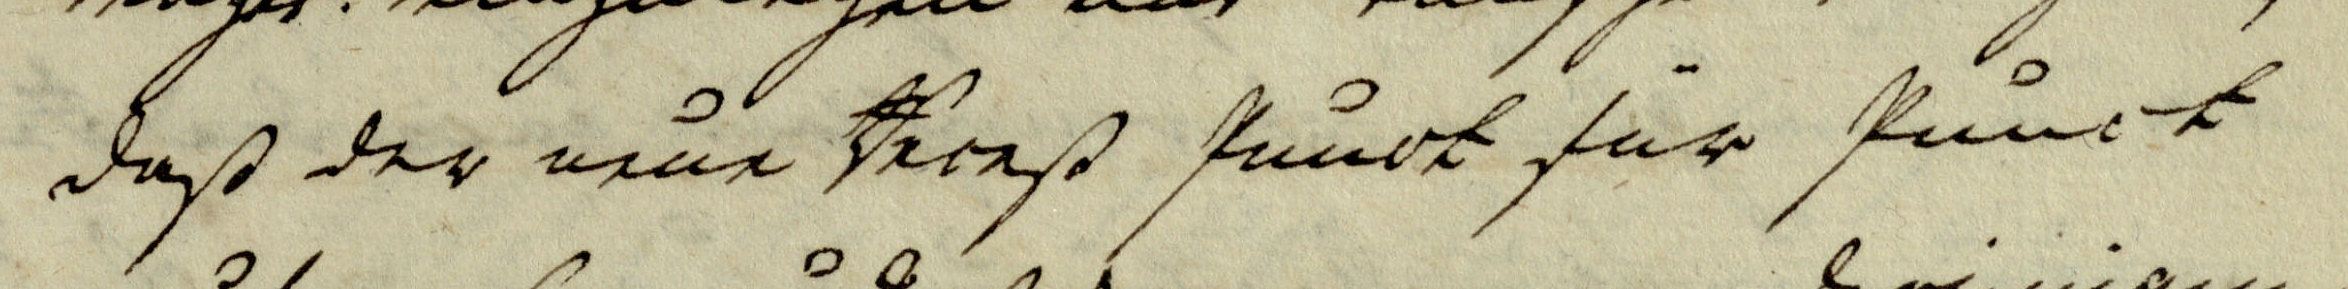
daß der neue Receß Punct für Punct
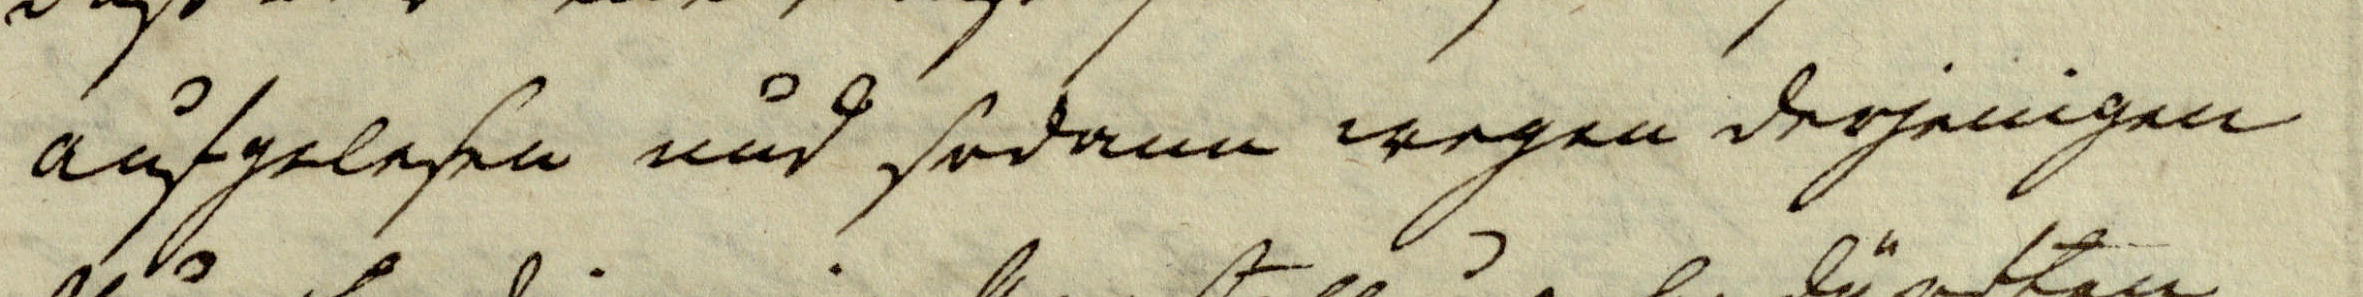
aufgelesen und sodann wegen derjenigen
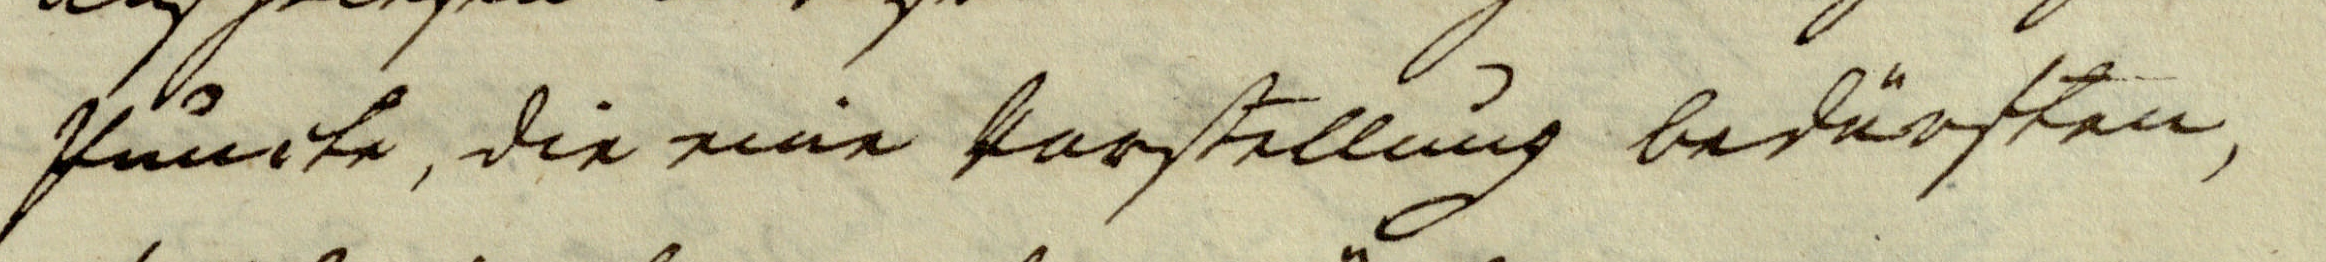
Puncte, die eine Vorstellung bedürften,
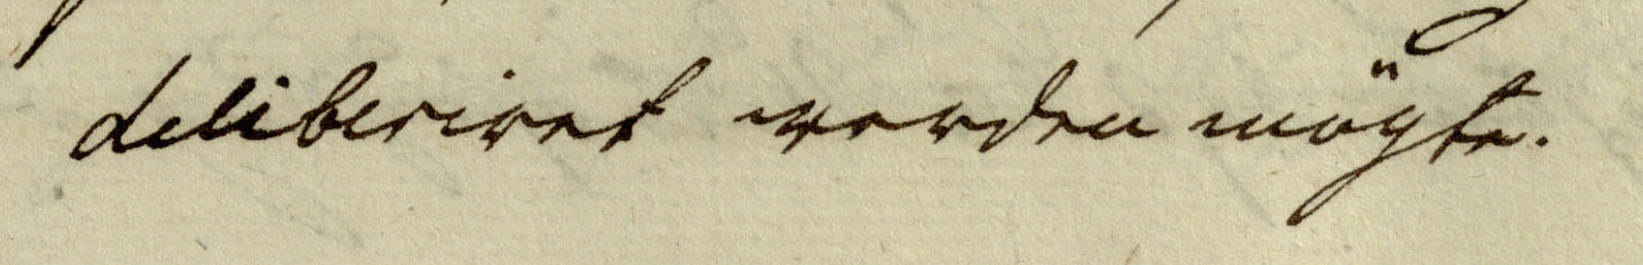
deliberiret werden mögte.
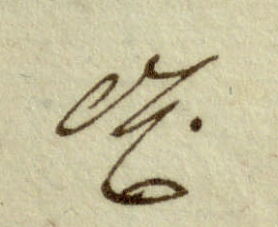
dh.
